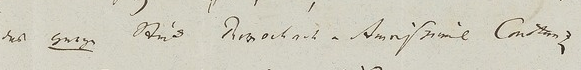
das ganze Stück Rorschach–AmrisweilConstanz
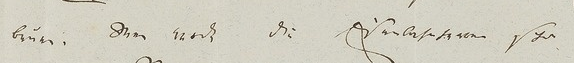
bauen. Man werde die Eisenbahnherren schon
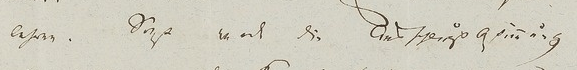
lehren. Sonst werde die Ausschlußabstimmung
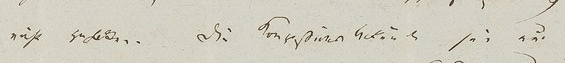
nicht gehalten. Die Konceßions Urkunde sei nur
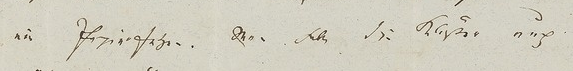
ein Papierfetzen. Man habe die Klöster auch
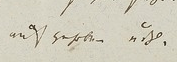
aufgehoben udgl.
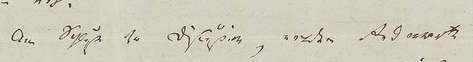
Am Schluße der Discußion, nachdem Anderwerth
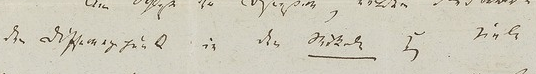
das Differenzstück in den Mitteln...viele
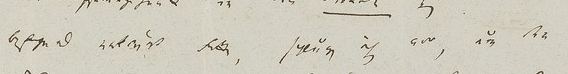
bestechend erklärt hatte, schlug ich vor, nun den
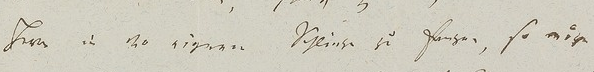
Herrn in der eigenen Schlinge zu fangen, so müße
